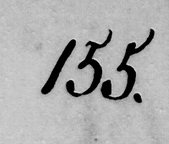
12.
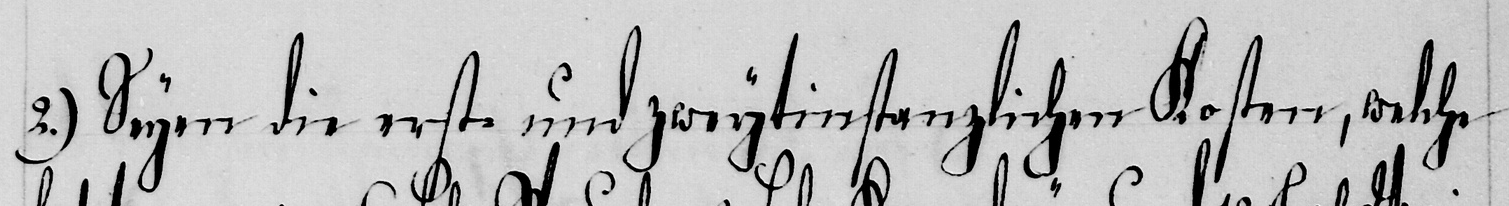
2.) Seyen die erst- und zweytinstanzlichen Kosten, welche
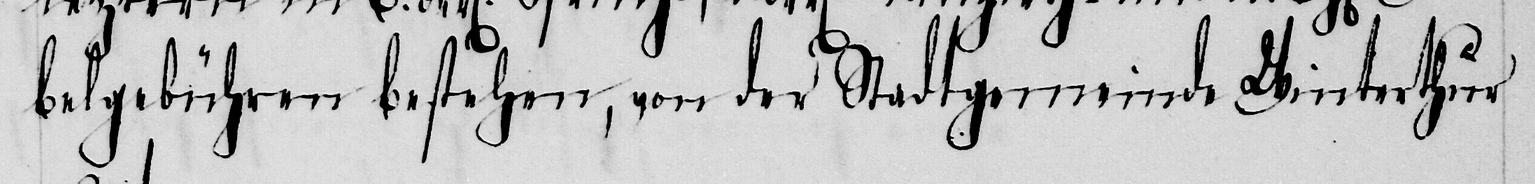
belgebühren bestehen, von der Stadtgemeinde Winterthur
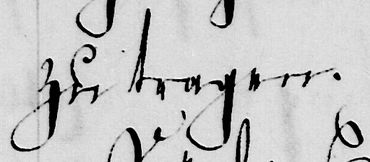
zu tragen.
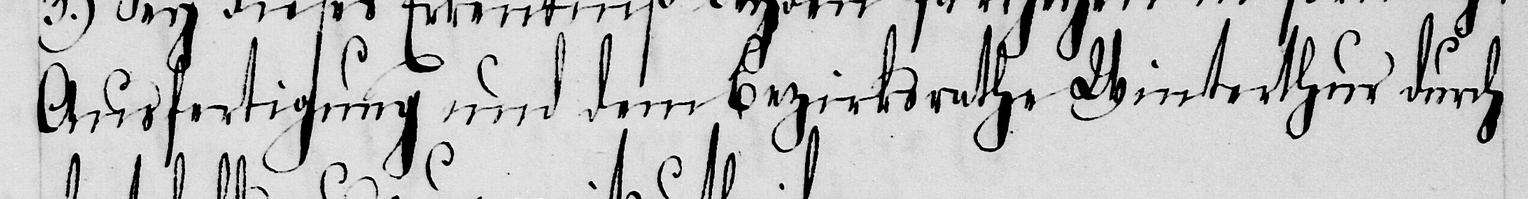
Ausfertigung und dem Bezirksrathe Winterthur durch
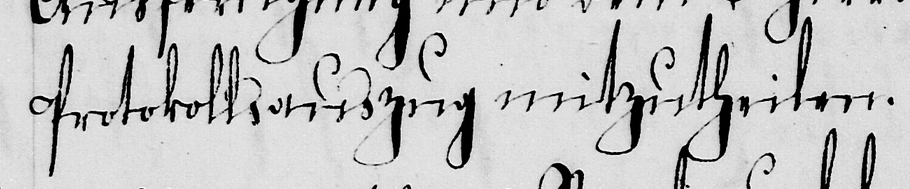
Protokollsauszug mitzutheilen.
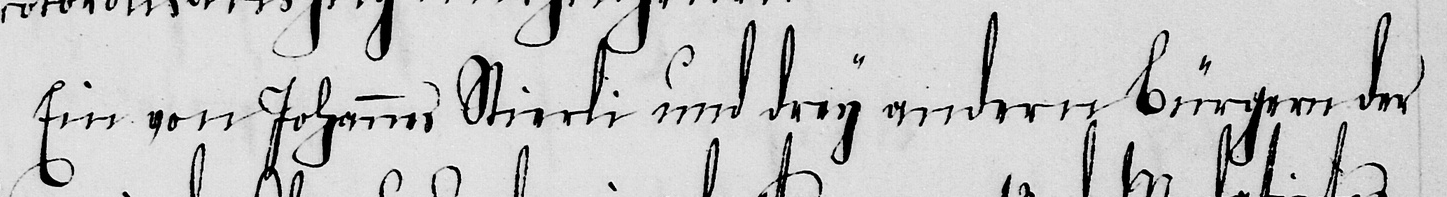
Ein von Johannes Stierli und drey andern Bürgern der
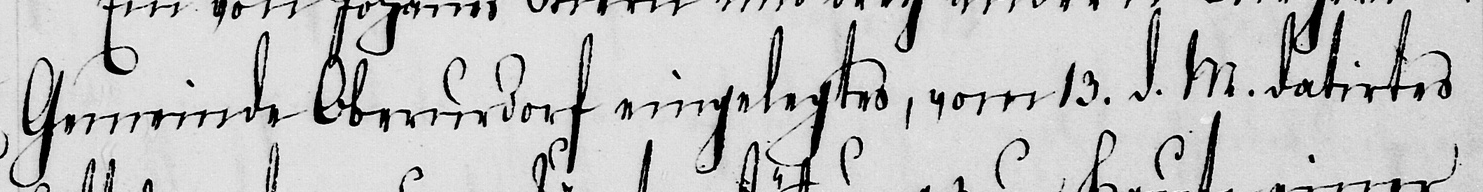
Gemeinde Oberurdorf eingelegtes, vom 13. d. M. datirtes
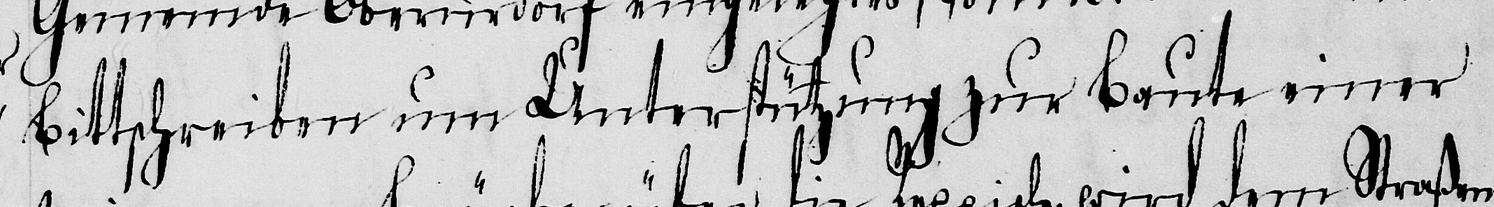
Bittschreiben um Unterstützung zur Baute einer
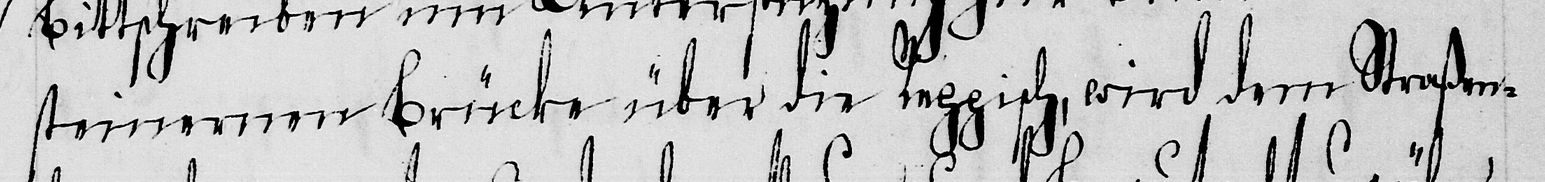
steinernen Brücke über die Reppisch, wird dem Straßen¬
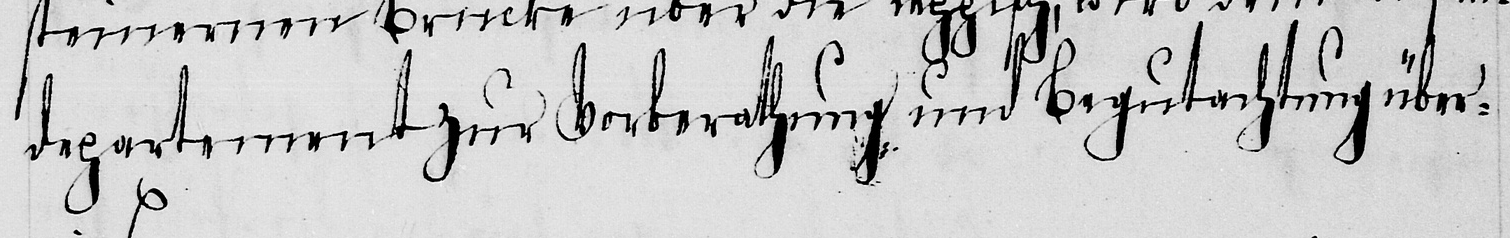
departement zur Vorberathung und Begutachtung über¬
